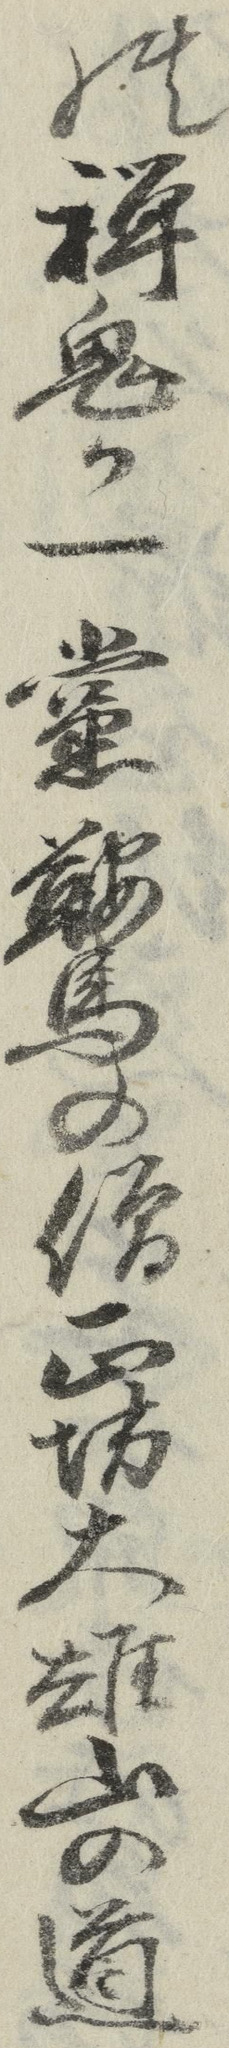禮禅鬼か一党鞍馬の僧正坊大雄山の道
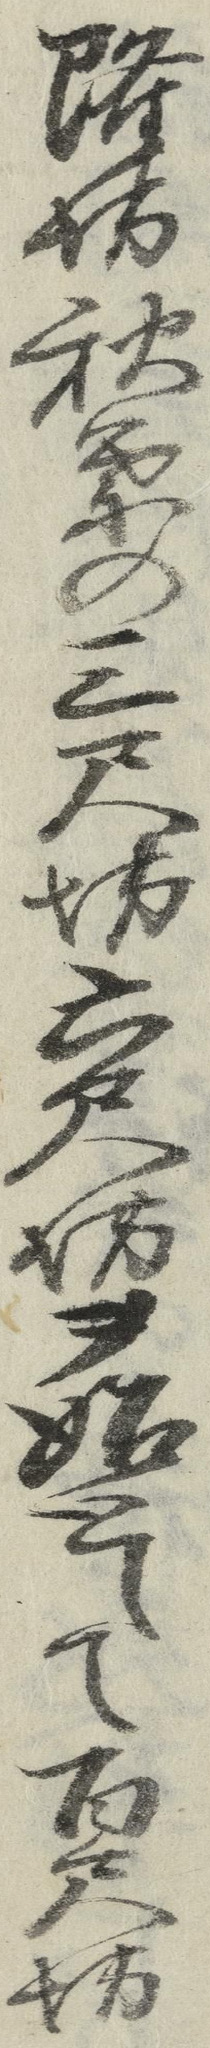隆坊秋葉の三尺坊六尺坊を始として百尺坊
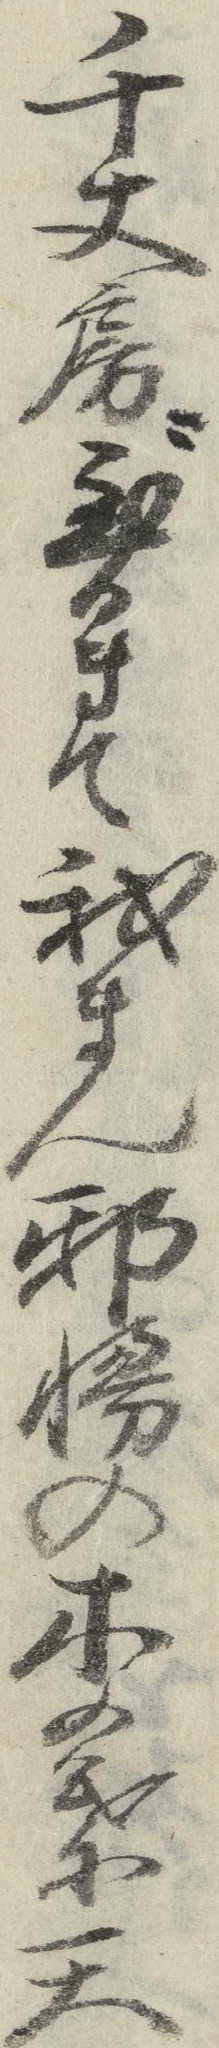千丈坊に至るまて我まん邪慢の木の葉天
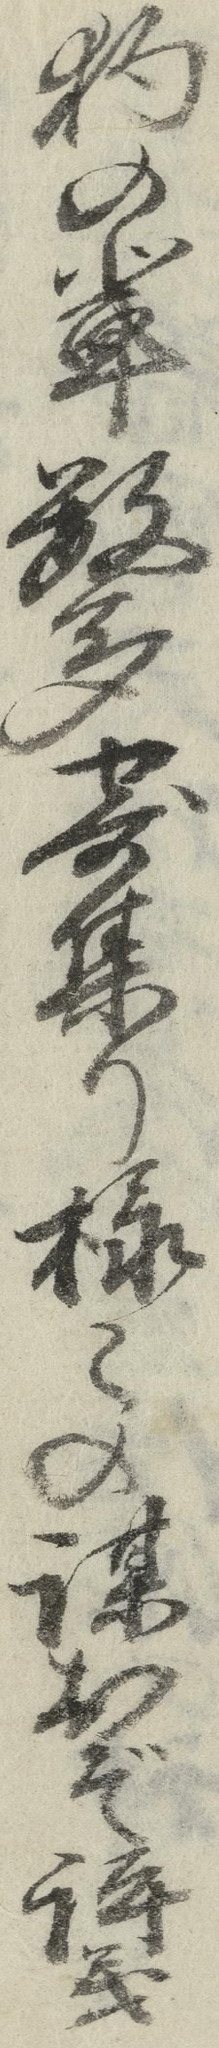狗の輩数多寄集り様々の謀出ぞ評義
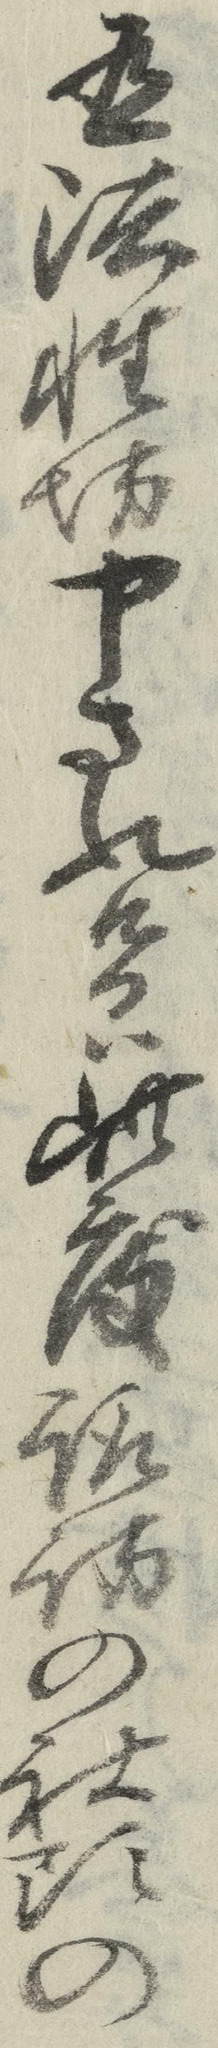有法性坊申されけるは此度諏訪の社頭の
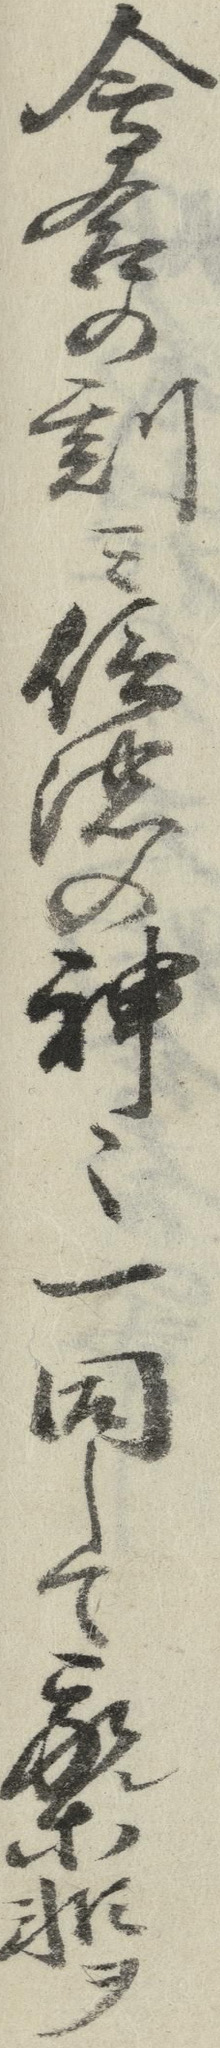会合の刻こく信濃の神々一同して我等非
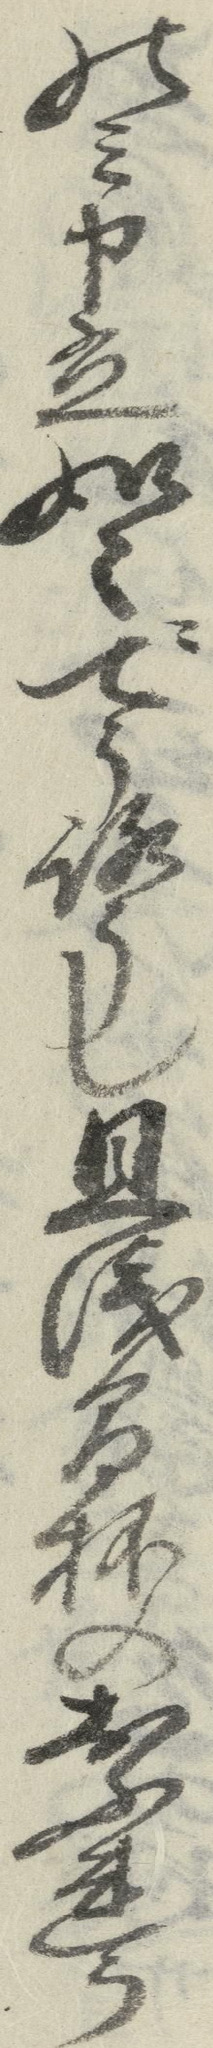のみ申立処々にてう給りし且浅間様のおふれう
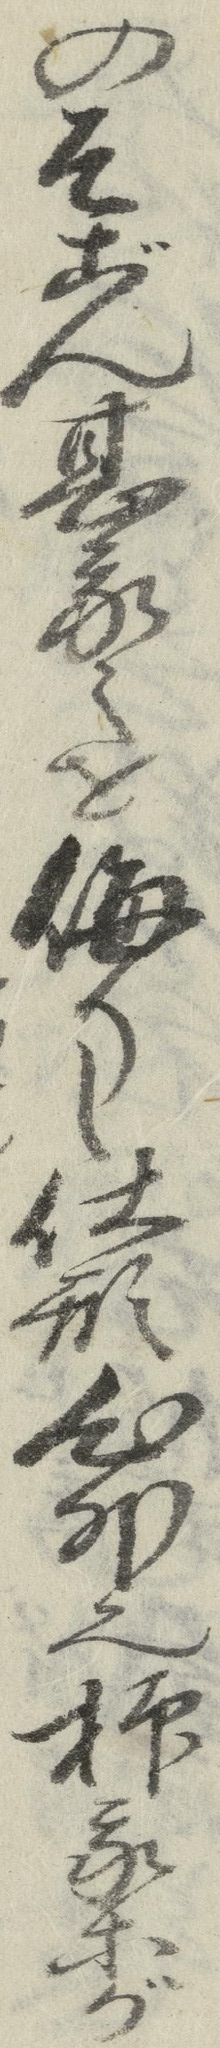のそごん甚我々を侮りし仕形尤外也抑我等が
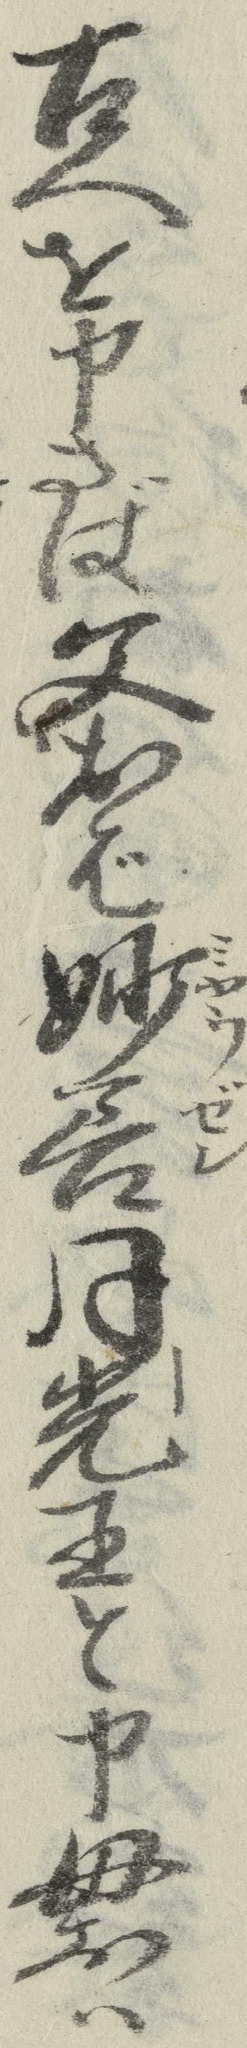古へを申さば父おば妙善月光王と申母なは
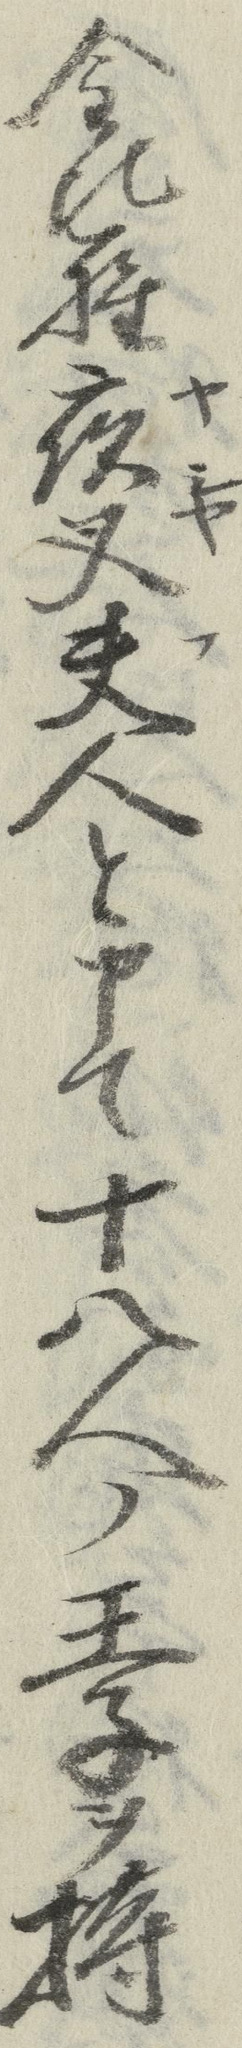金比羅夜叉夫人と申て十八人ノ王子ヲ持
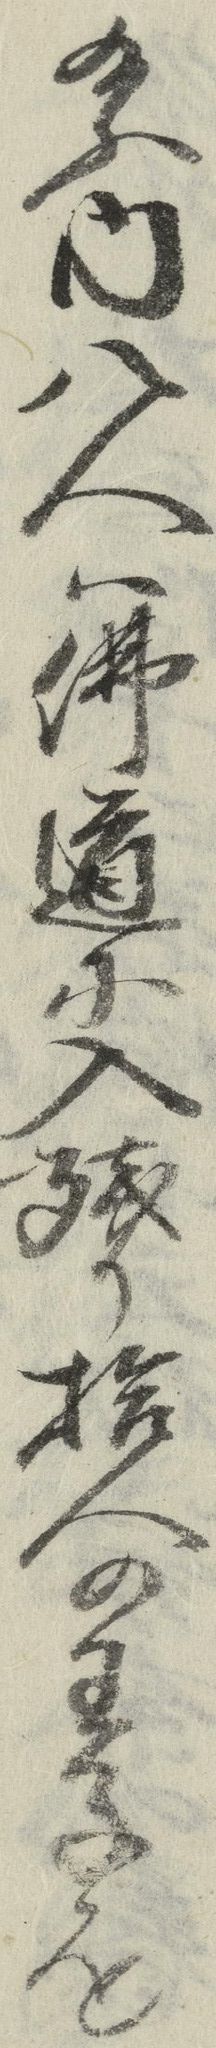給ふ内八人は仏道に入残り拾人の王子を
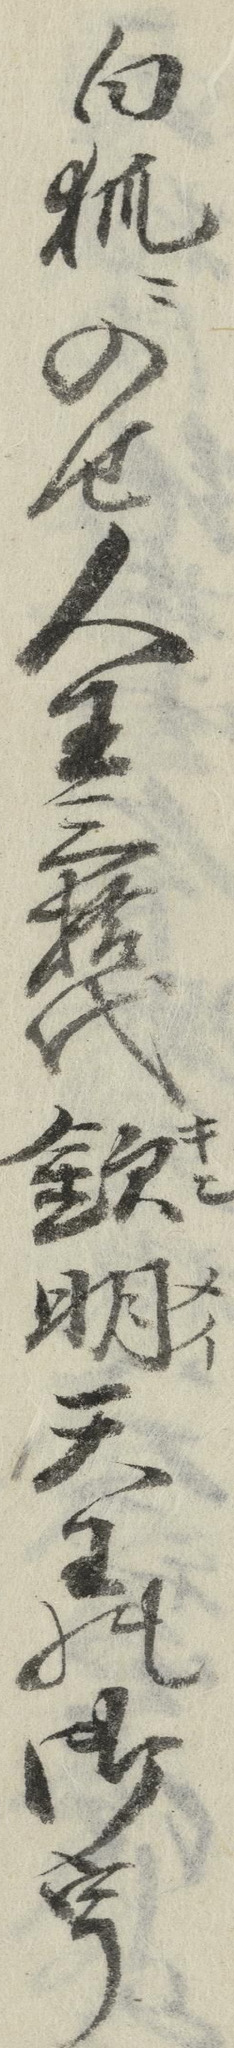白狐にのせ人王三拾代欽明天王の御宇
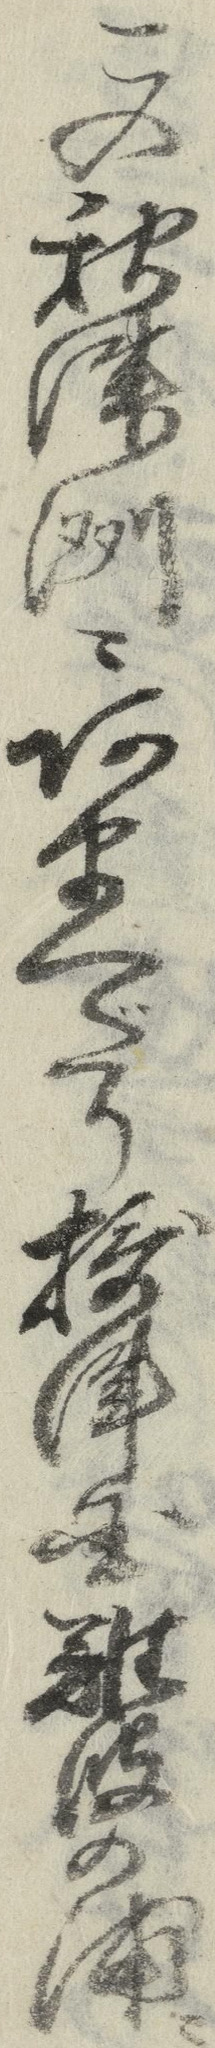この秋津洲にあまくだり摂津国難波の浦に
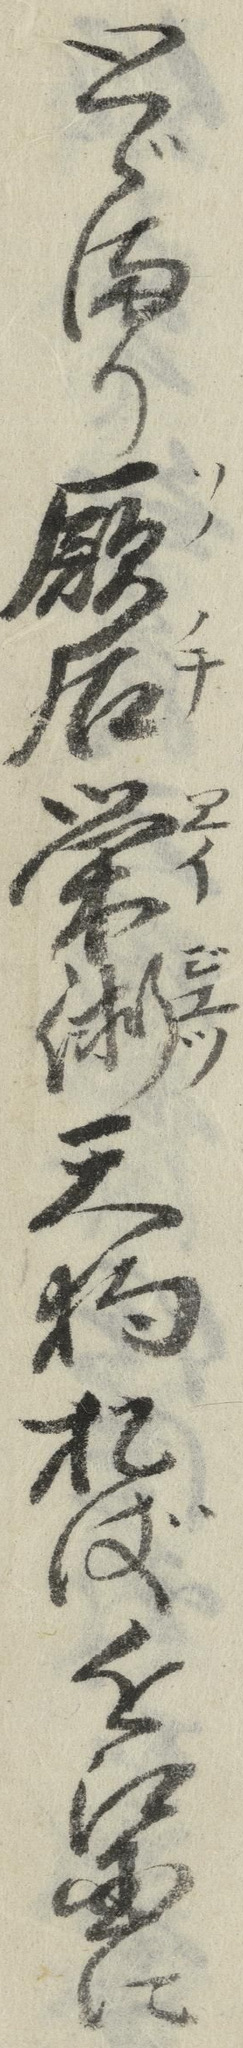とヾまり厥后栄術天狗杞ばを江国

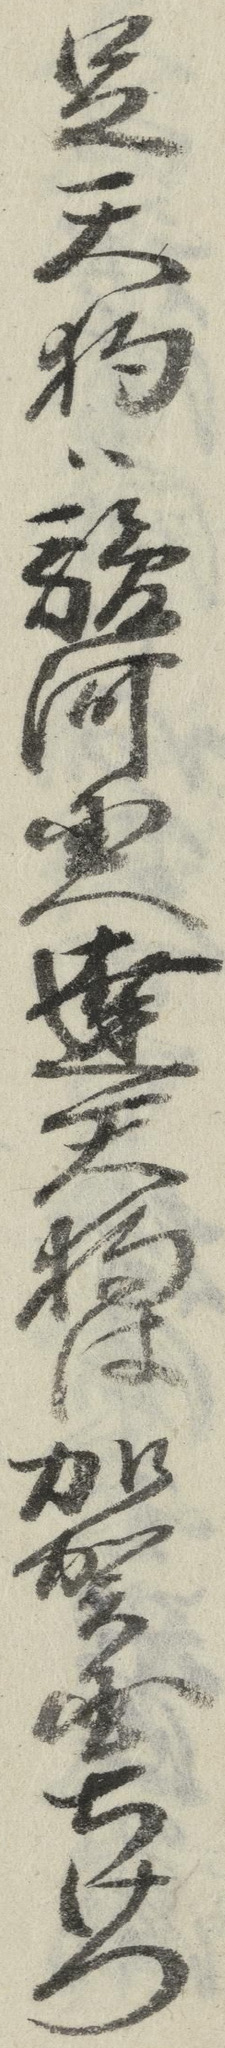足天狗は駿河国へ達天狗は加賀国ちけつ
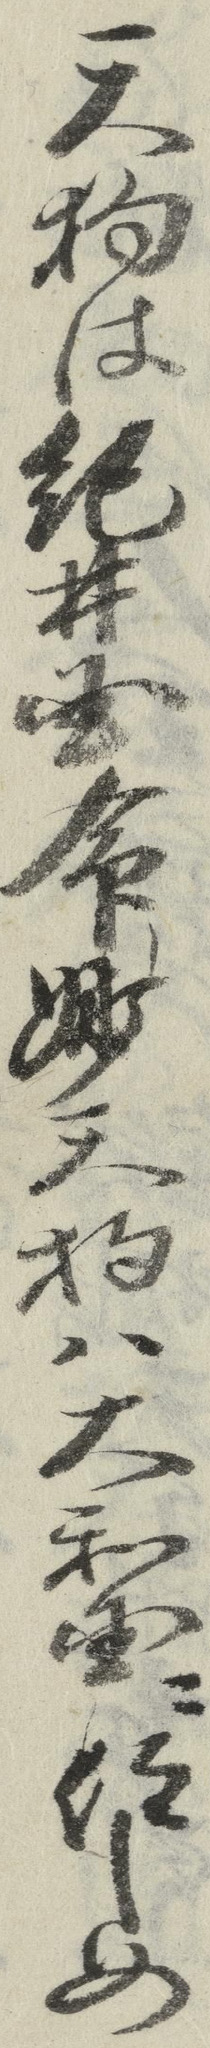天狗は紀伊国命妙天狗は大和国に住しめ
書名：浅間大焼騒動記　上
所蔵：東京大学地震研究所図書室 Earthquake Research Institute Library, The University of Tokyo, JAPAN
